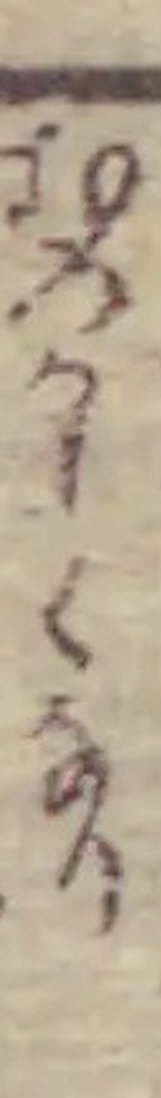むつかしくなり
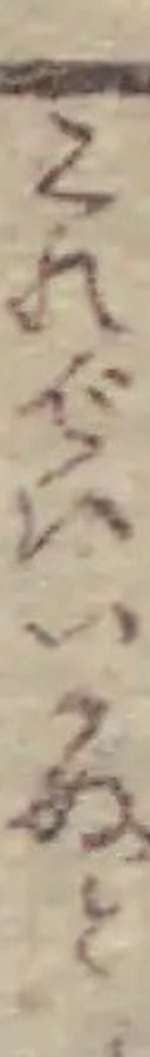これではいかぬと
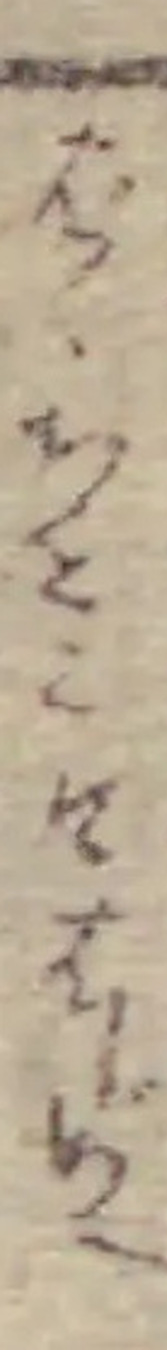ばくちをこそはじめ
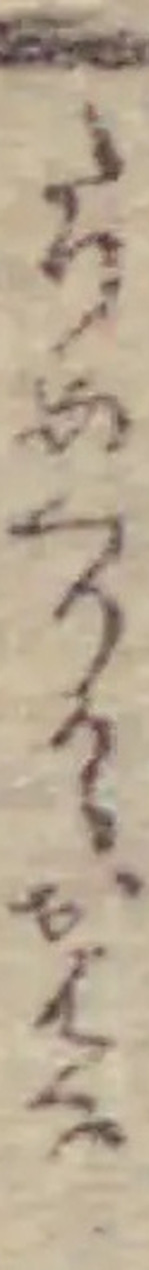たりめくりからおはな
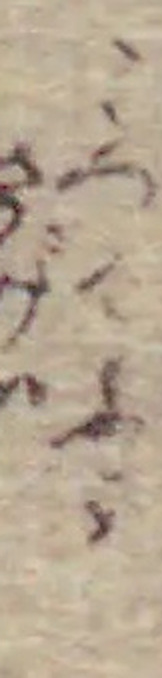さげは
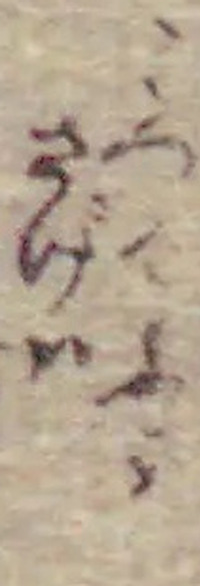さげは
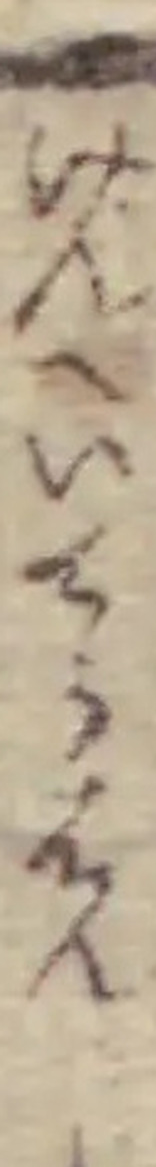げんへいてうはん
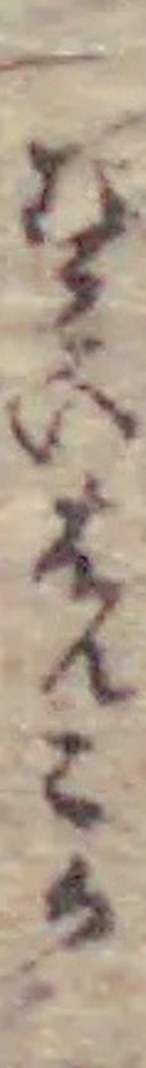むこいはんこか
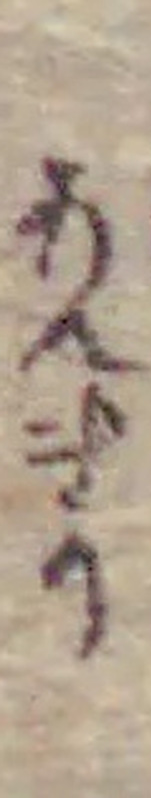あんまり
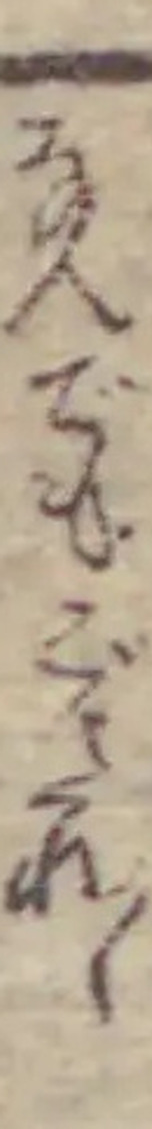なんでもござれ〳〵
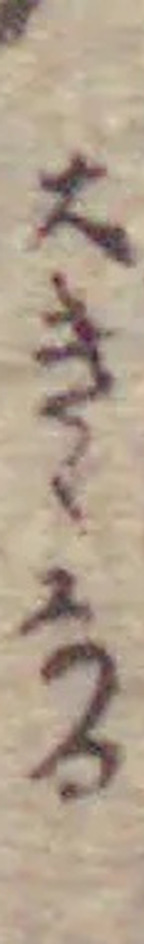大きくなる
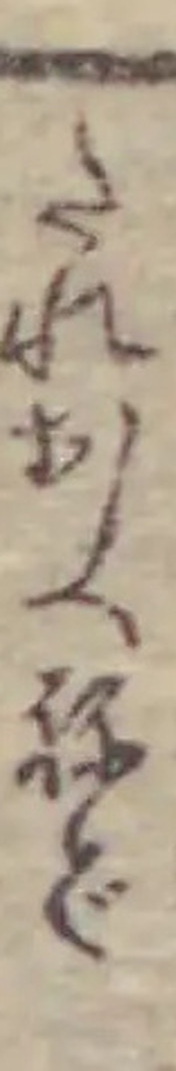たれおしへねど
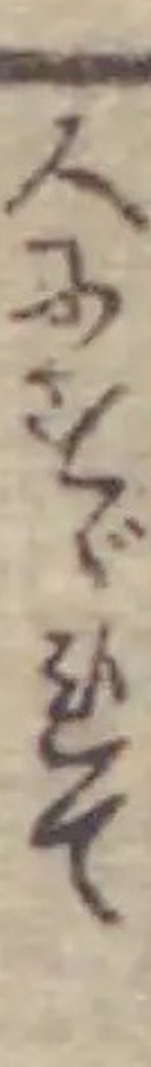人にすぐれて
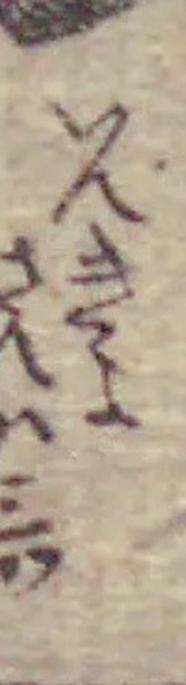いんきよ
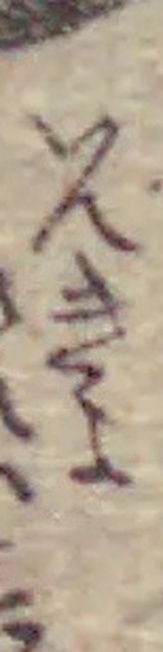いんきよ
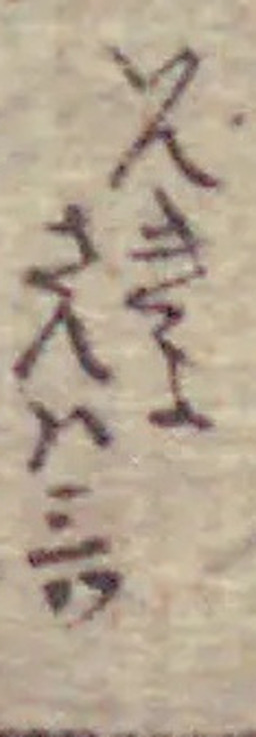さんは三つ
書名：夜野中狐物 2巻
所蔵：国立国会図書館 National Diet Library, JAPAN
